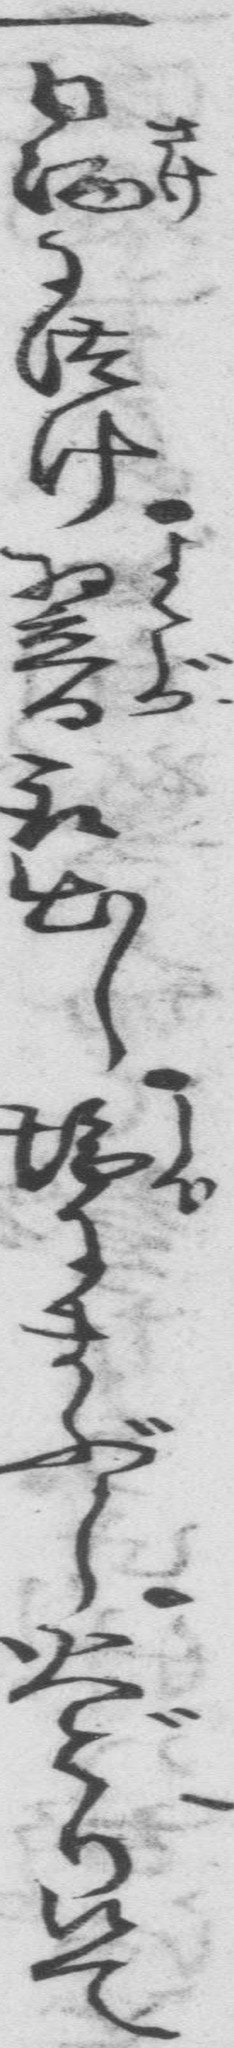一日酒につけ。翌日取出し。塩にまぶし。火どり候て
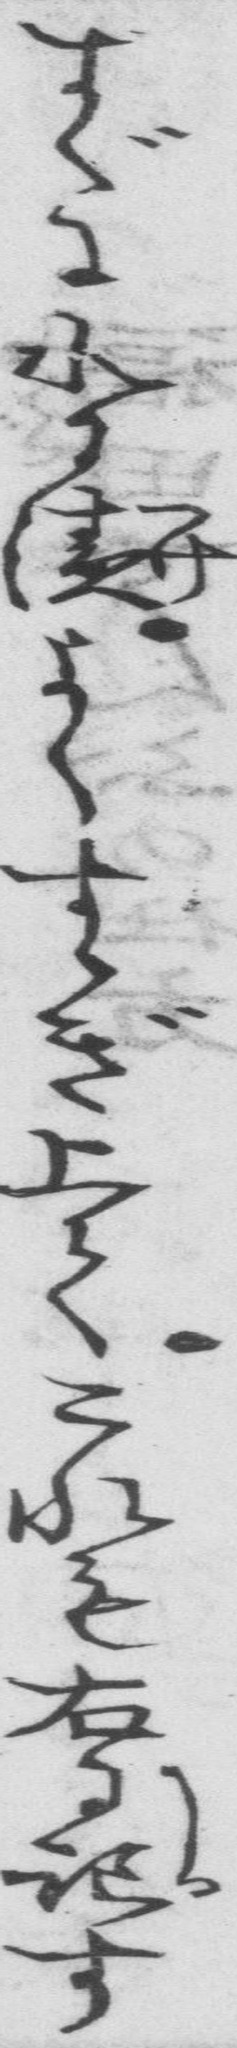すぐに水に漬。よくすゝぎ上て。これも右に記す
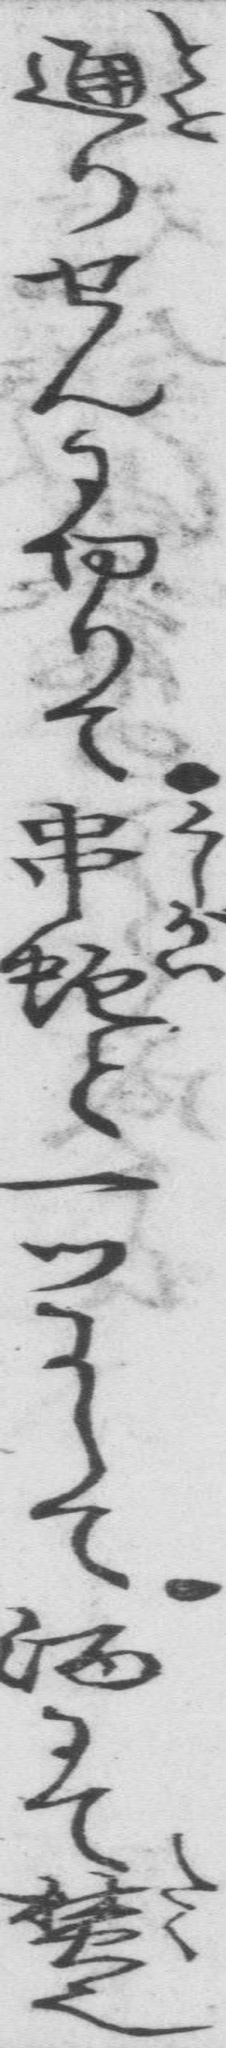通りせんに切りて。串鮑と一ツにして。酒にて焚也
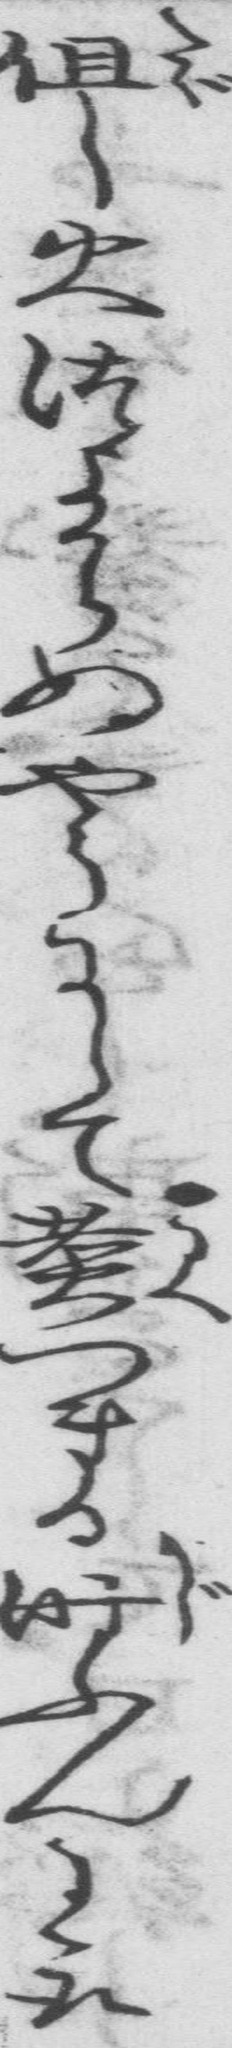但し火つよからぬやうにして。煮つまる時ふんに取
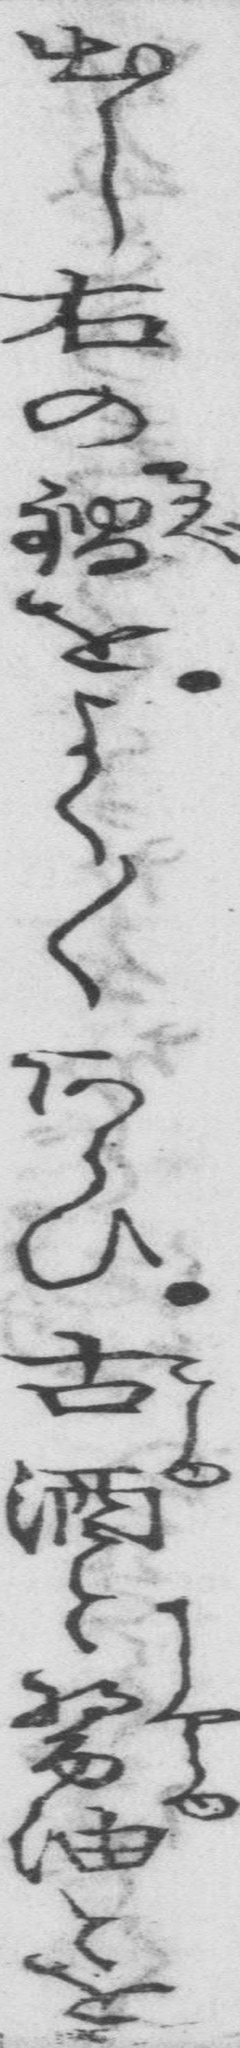出し右の鍋を。よく〳〵あらひ。古酒と醤油とを
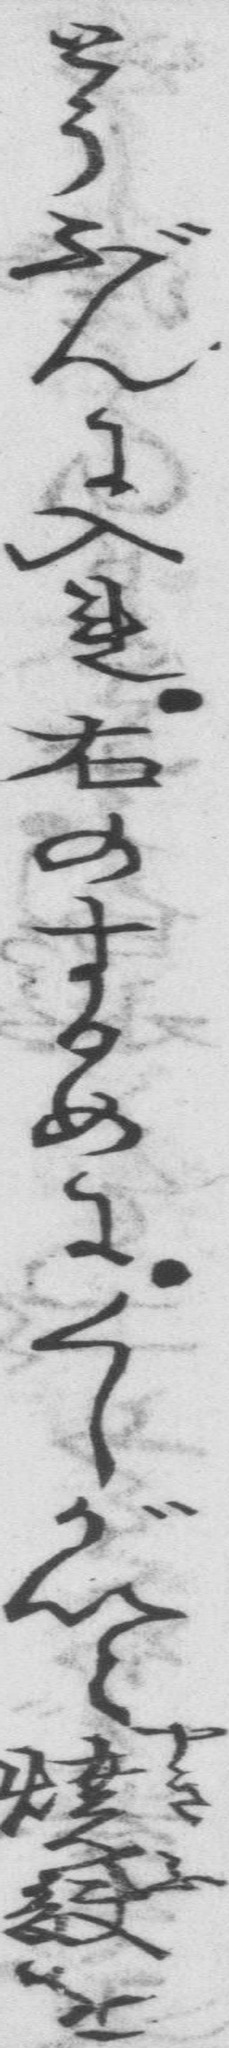とうぶんに入れ。右のするめに。くしがいと焼麩を
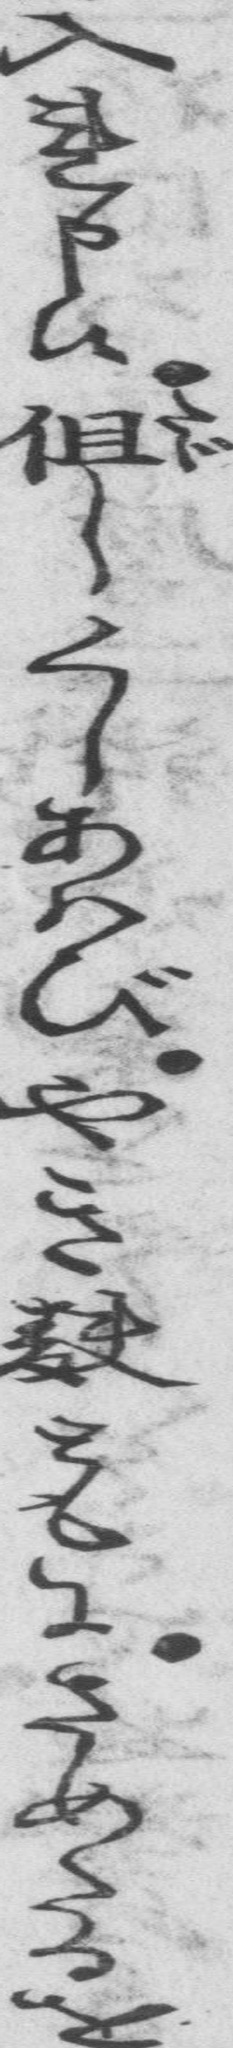入れ申候。但しくしあはび。やき麩ともに。さめたるを
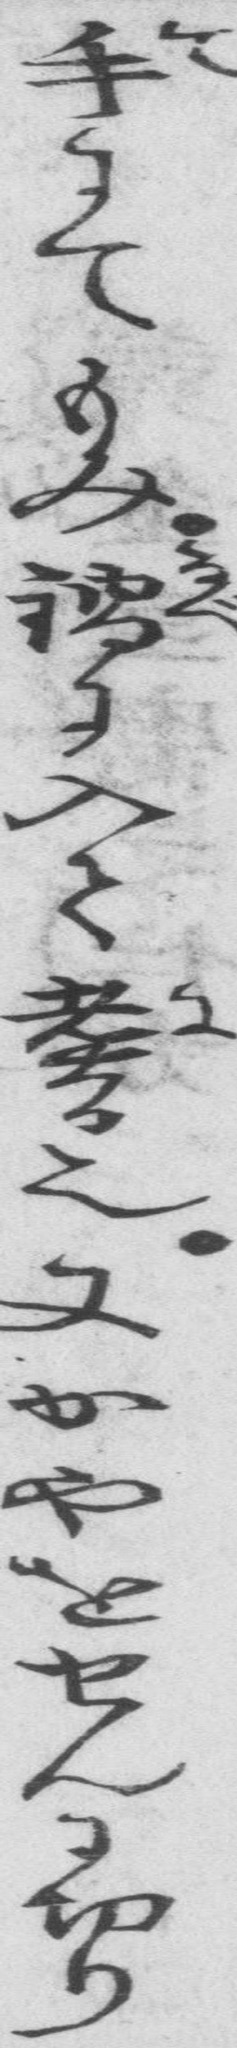手にてもみ。鍋に入て煮る也。又かやをせんに切り
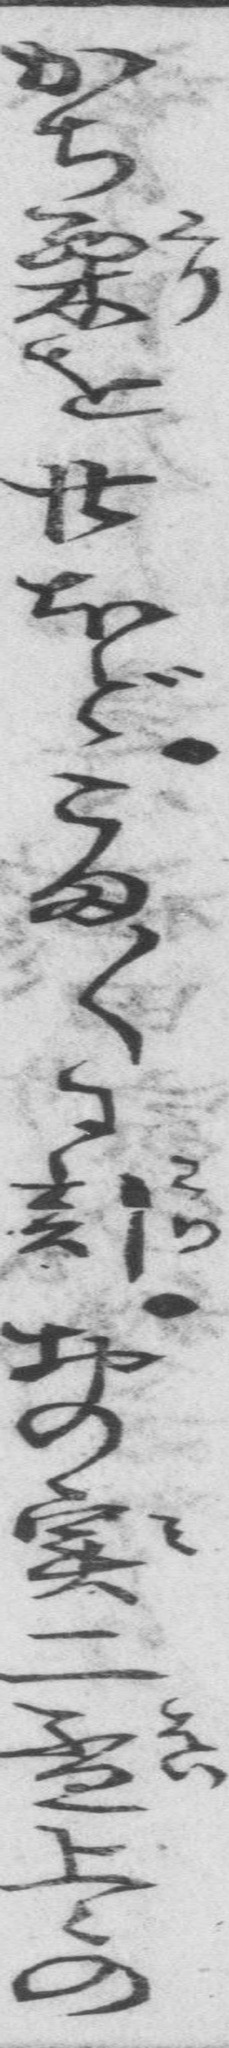かち栗を廿ほど。こま〳〵に割。おの実二盃上々の
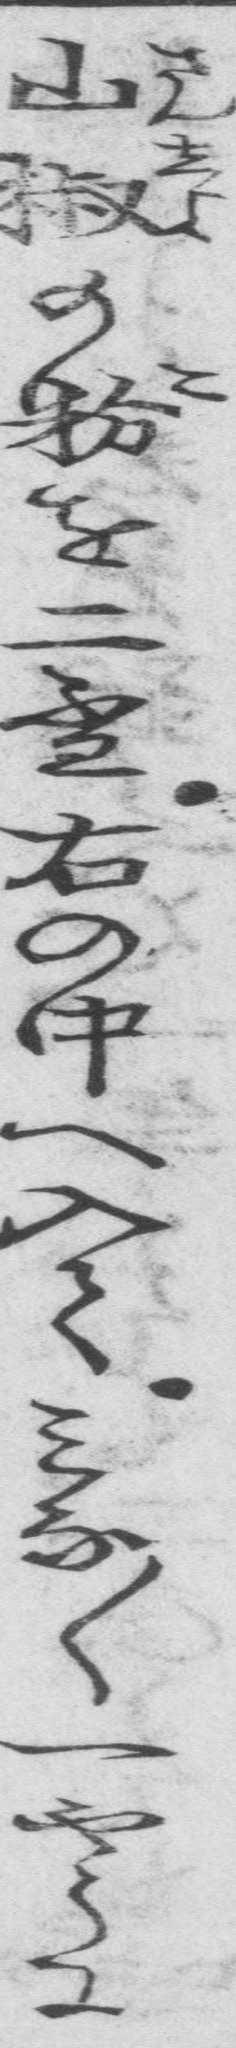山椒の粉を二盃。右の中へ入て。みな〳〵一やうに
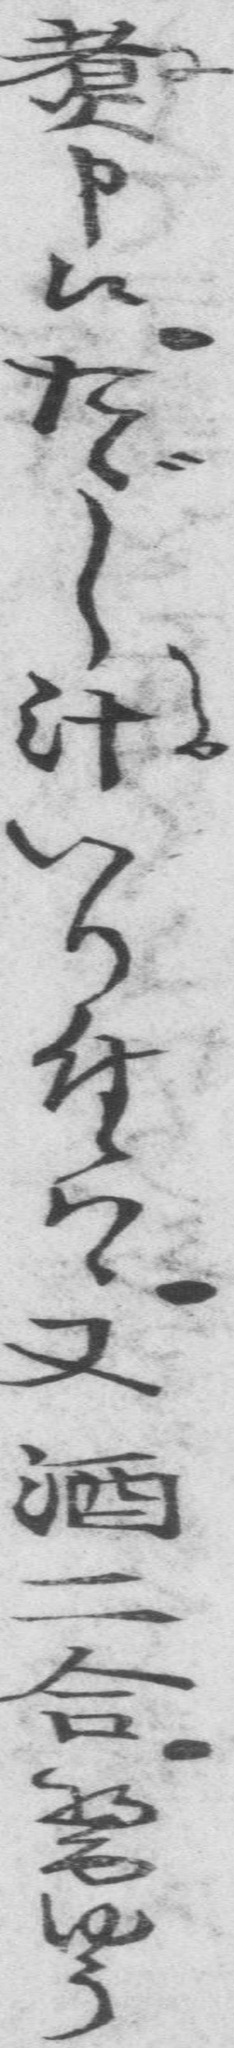煮申候。たゞし汁いり付候はゝ。又酒二合。醤ゆう
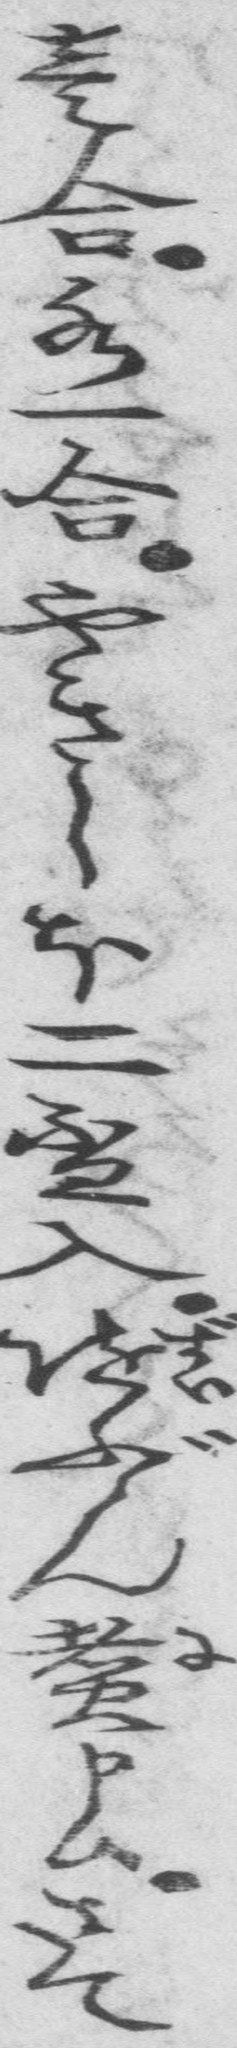壱合。水一合。やきしほ二盃入。随ぶん煮申候。さて
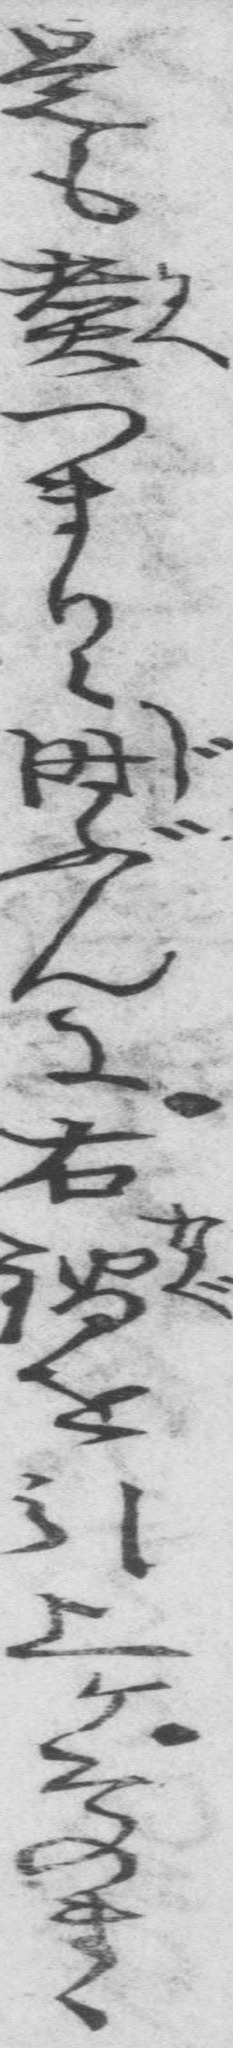是も煮つまり候時ぶんに。右鍋を引上け。そのまゝ
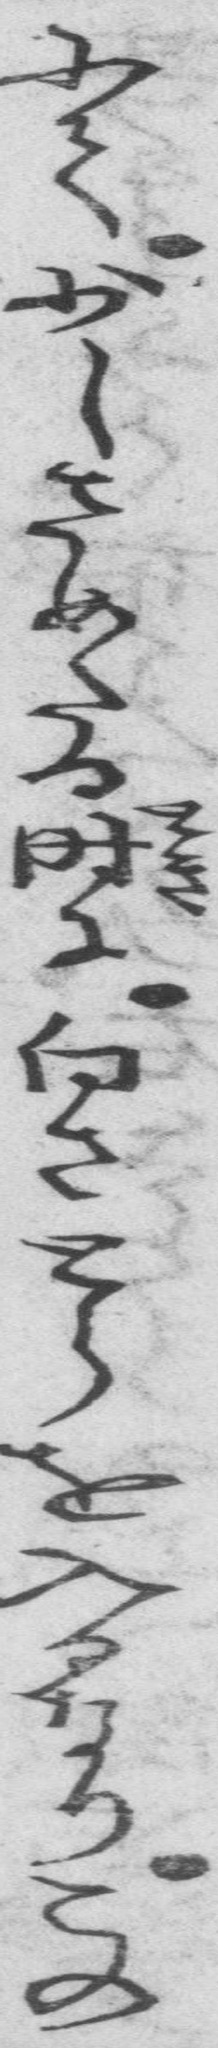にて。少しさめたる時に。白さとうを入るなり。この
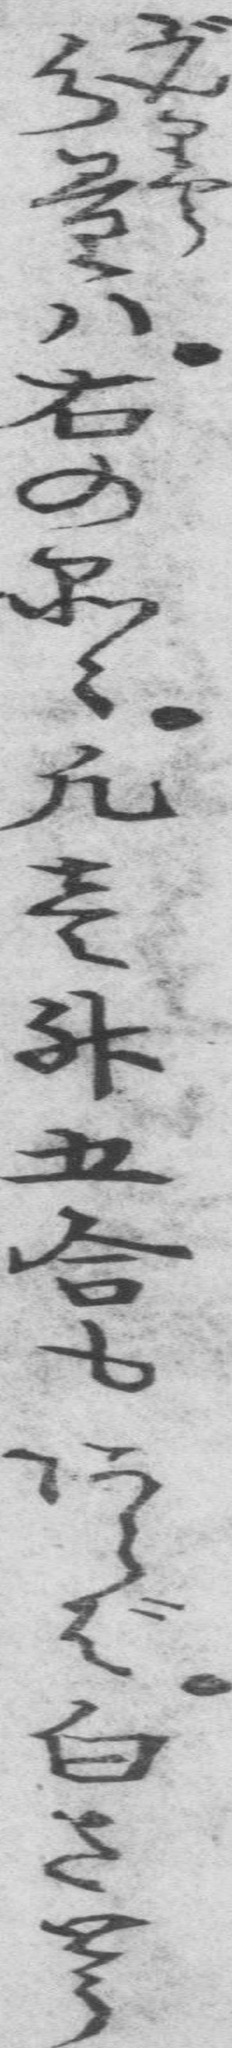分量は。右の品々。凡壱升五合もあらば。白さとう

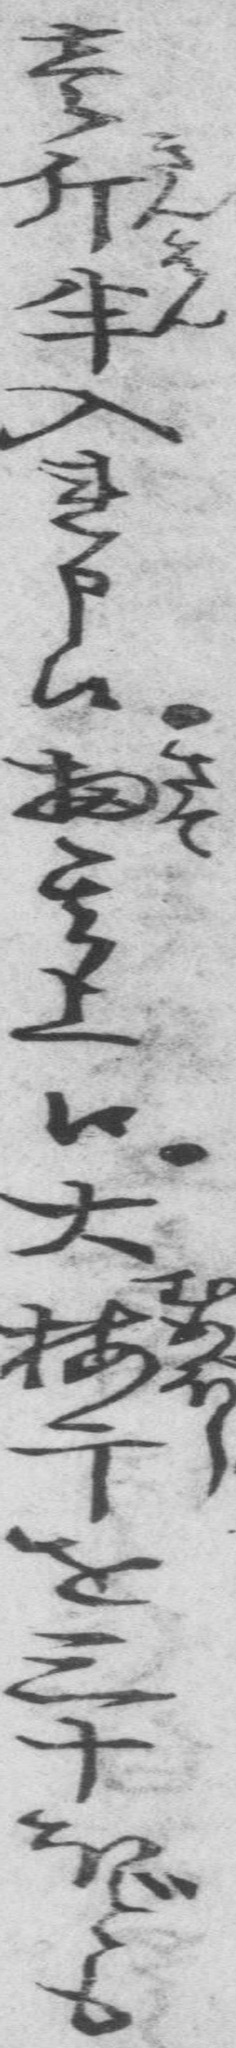壱斤半入れ申候。扨其上え。大梅干を三十ほども
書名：萬寳料理秘密箱
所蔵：大阪府立大学学術情報センター 国文学研究資料館
